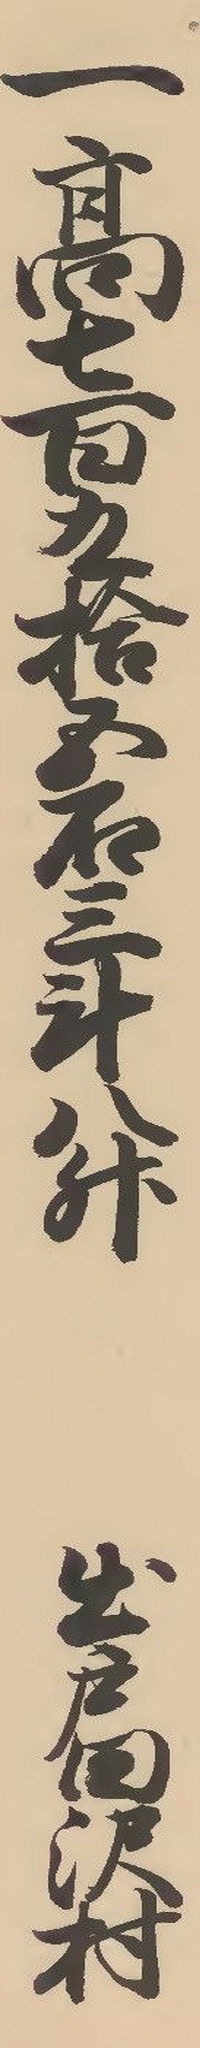一高七百九拾五石三斗八升出戸田沢村
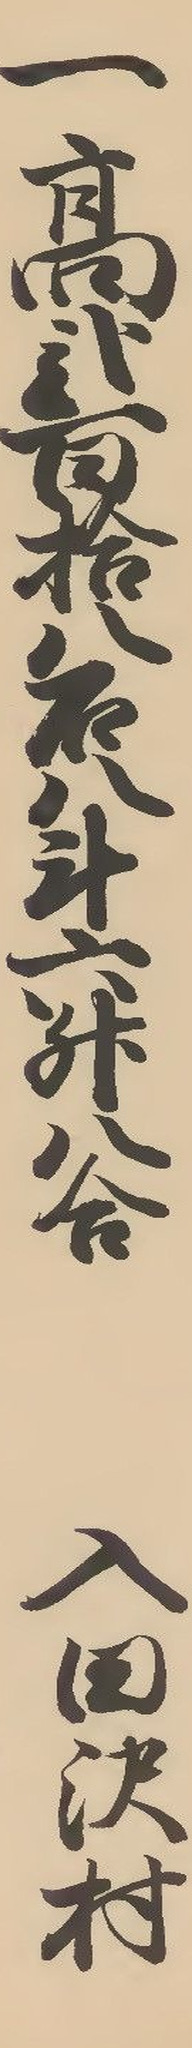一高弐百拾八石八斗六升八合入田沢村

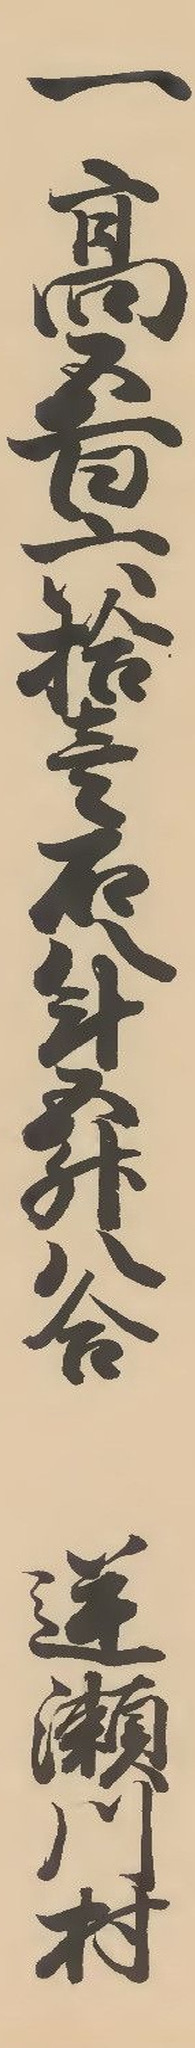一高五百六拾壱石八斗五升八合逆瀬川村
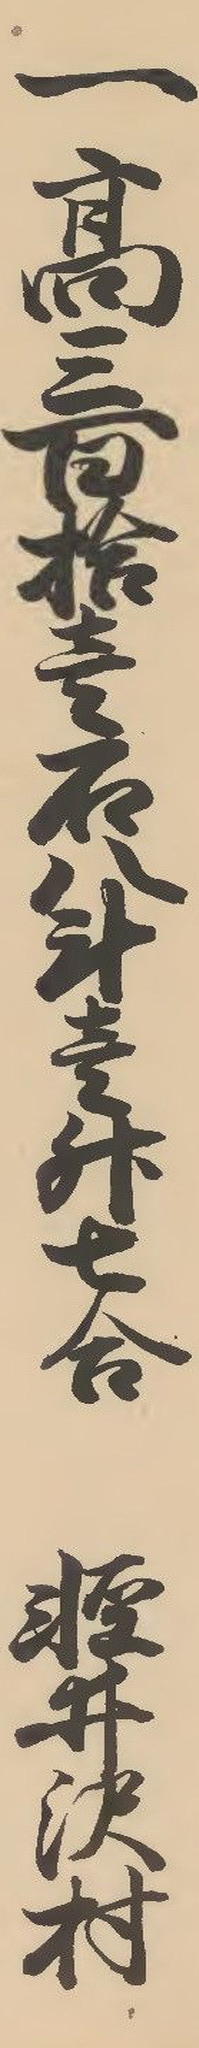一高三百拾壱石八斗壱升七合軽井沢村
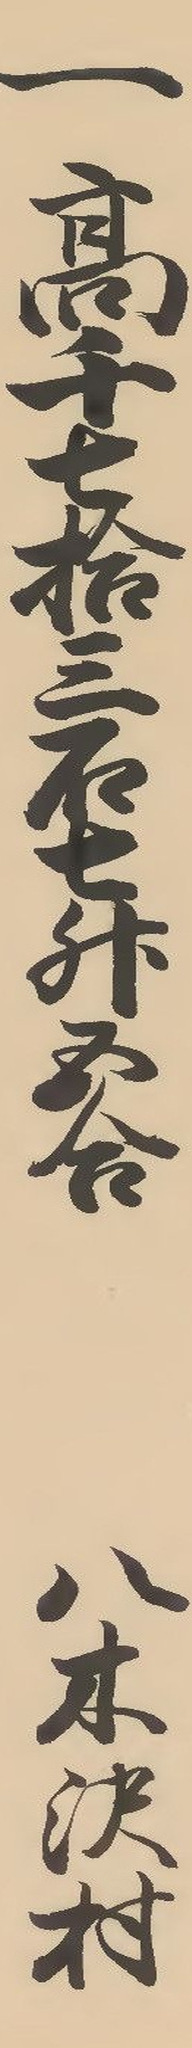一高千七拾三石七升五合八木沢村
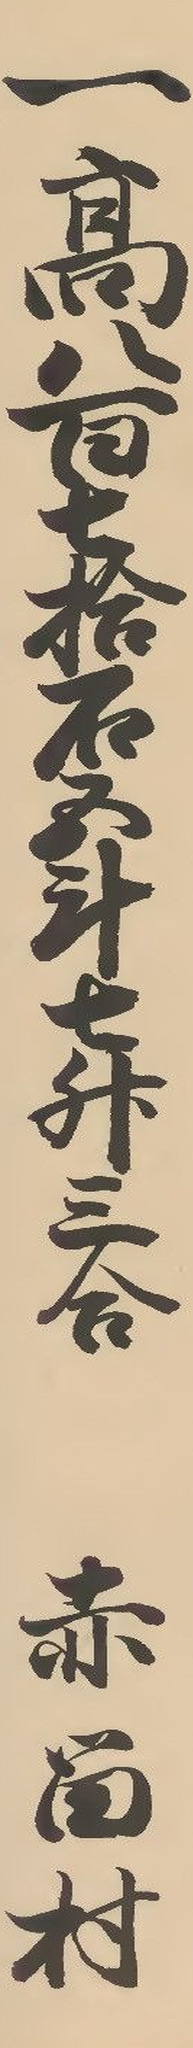一高八百七拾石五斗七升三合赤留村
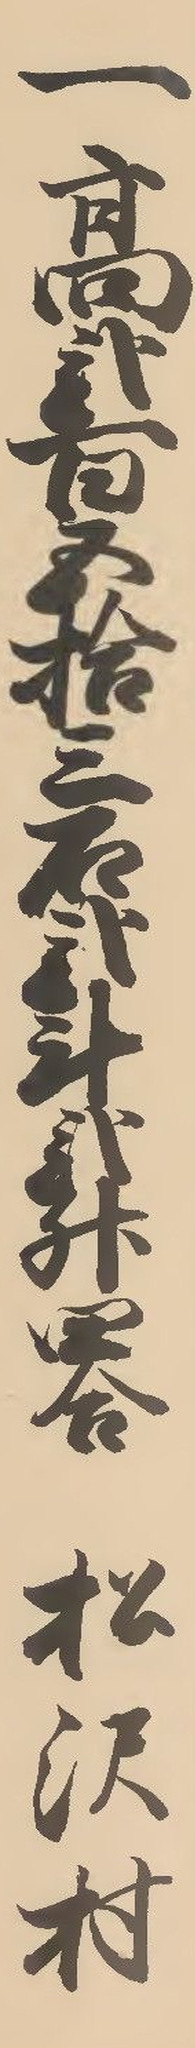一高弐百五拾三石弐斗弐升四合松沢村
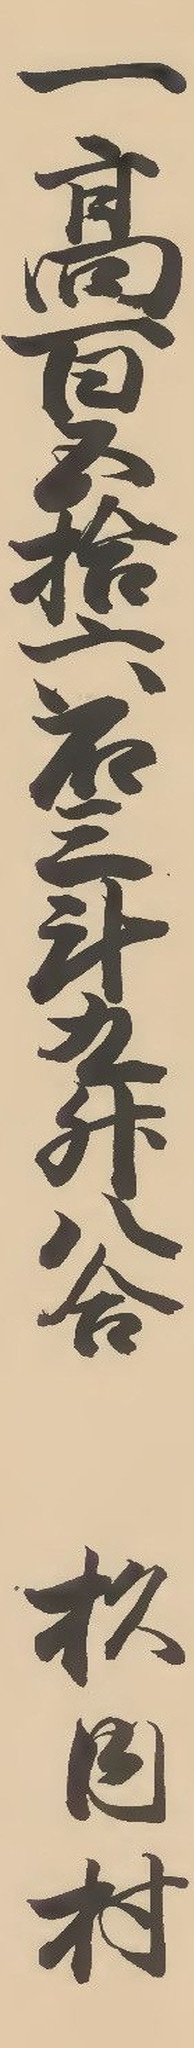一高百五拾六石三斗九升八合杉内村
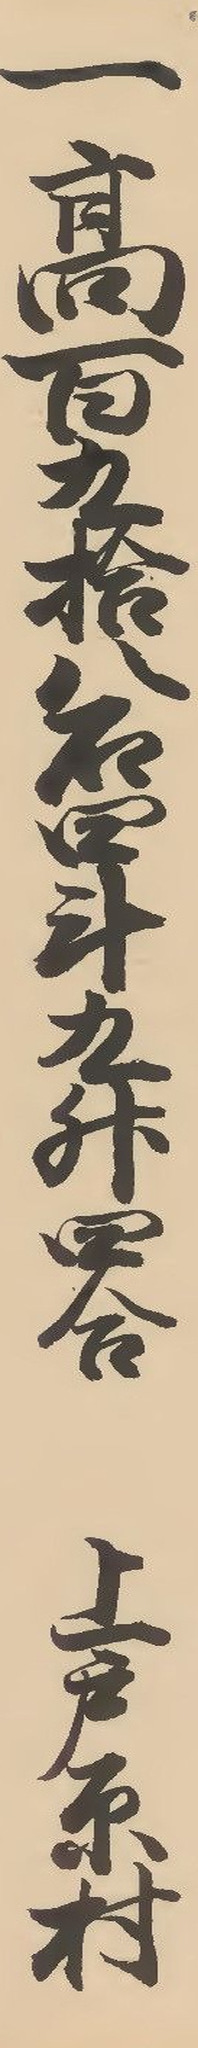一高百九拾八石四斗九升四合上戸原村
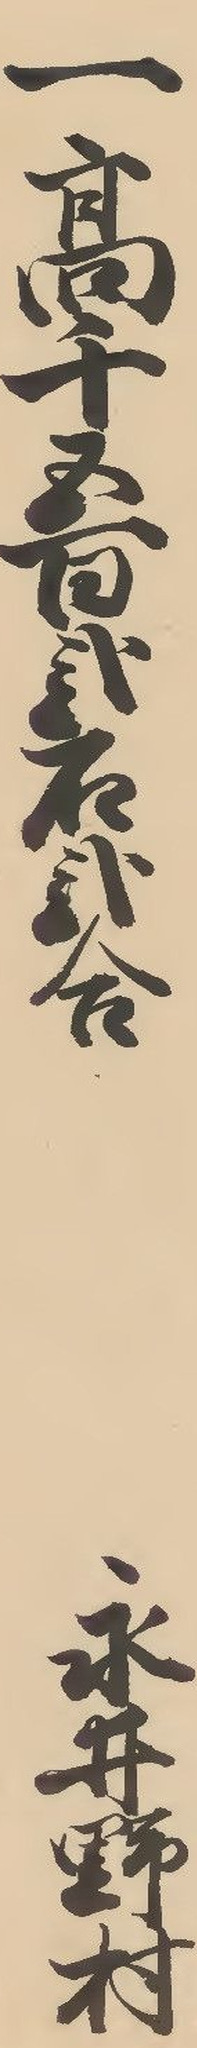一高千五百弐石弐合永井野村

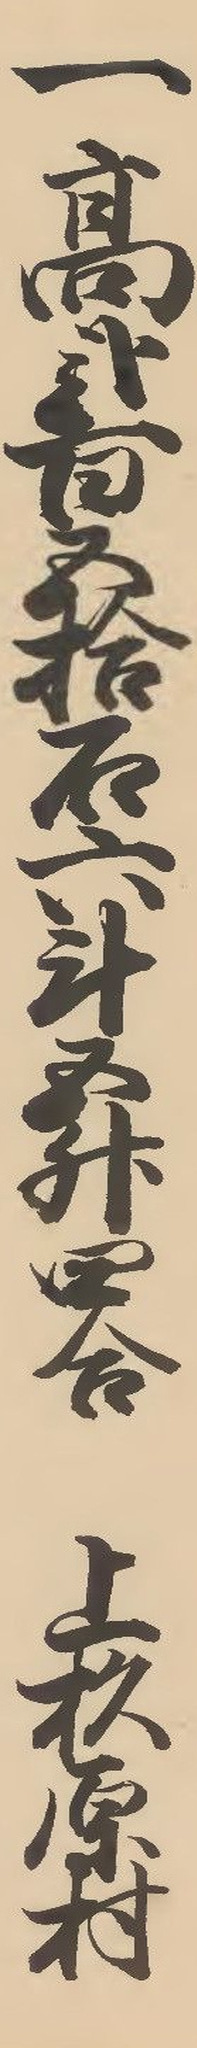一高弐百五拾石六斗五升四合上杉原村
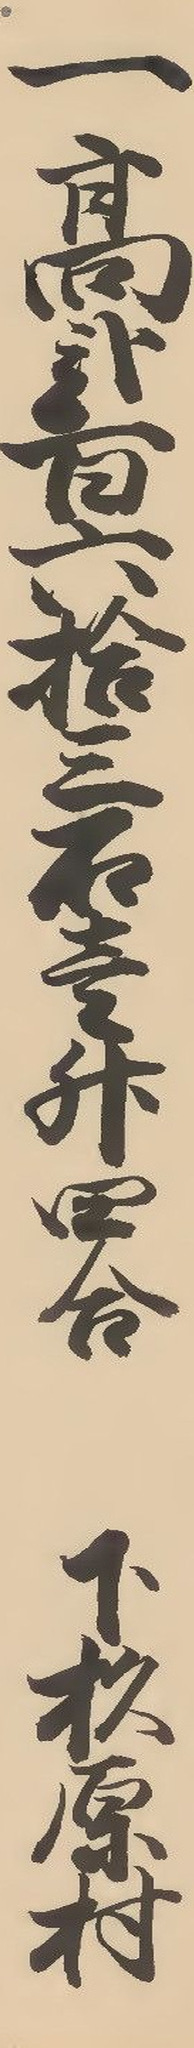一高弐百六拾三石壱升四合下杉原村
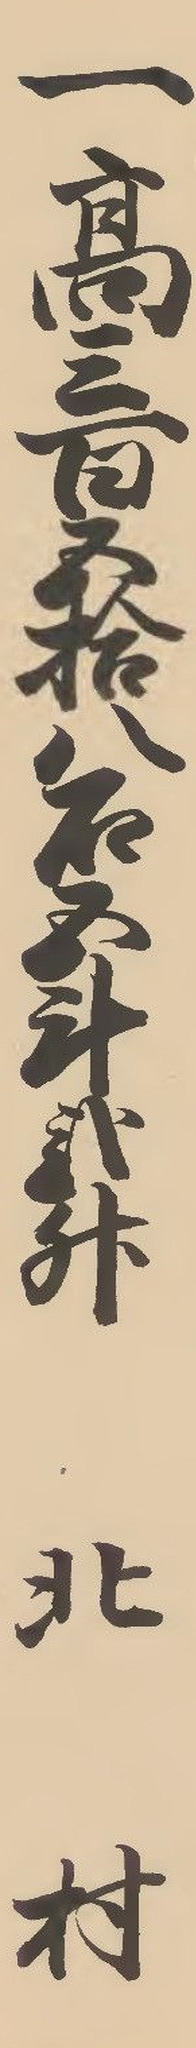一高三百五拾八石五斗弐升北村
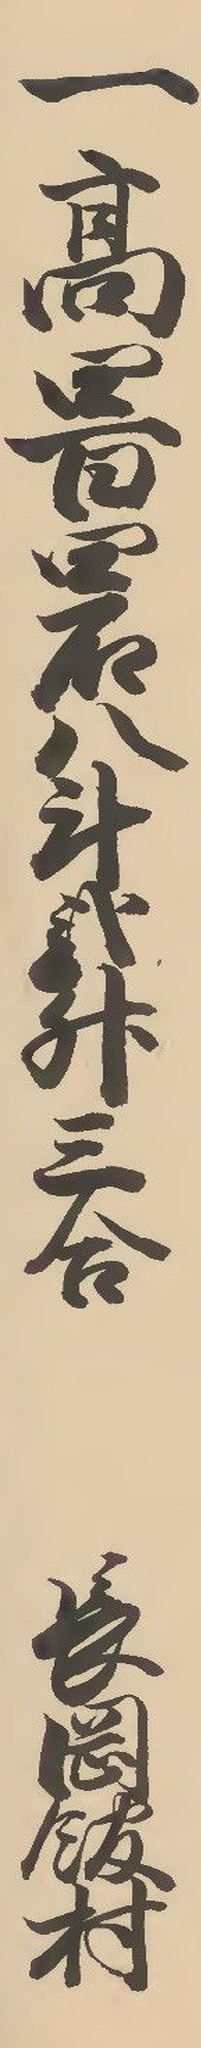一高四百四石八斗弐升三合長岡館村
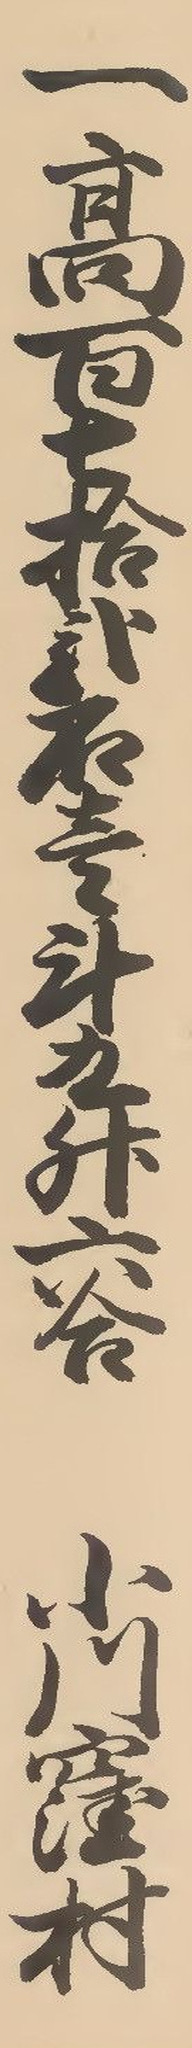一高百七拾弐石壱斗九升六合小川窪村
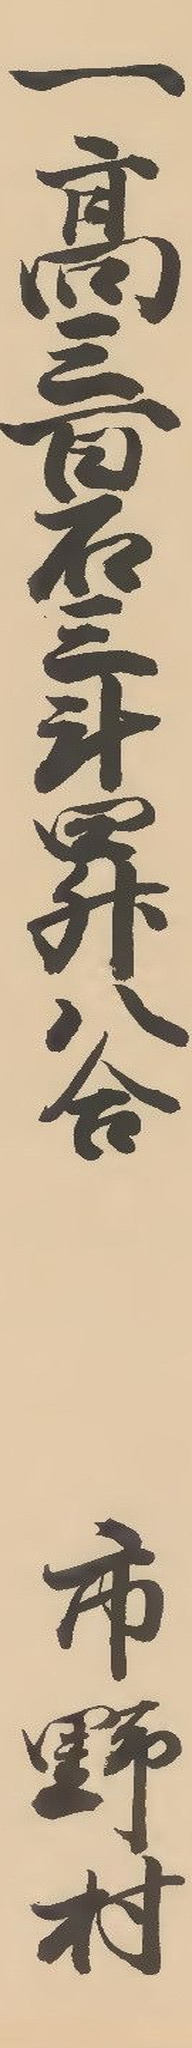一高三百石三斗四升八合市野村
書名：陸奥国郷帳　１
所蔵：国立公文書館 National Archives of Japan
